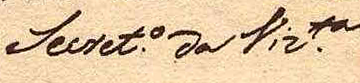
Secret.o da Viz.ta
